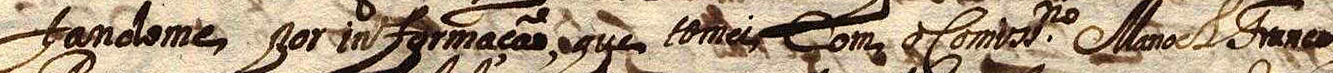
tandome por informação, que tomei Com o Comiss.ro Manoel Franco
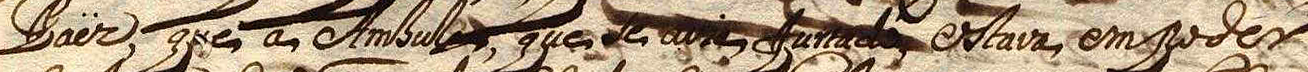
Paez, que a Ambula, que se avia furtado, estava em poder
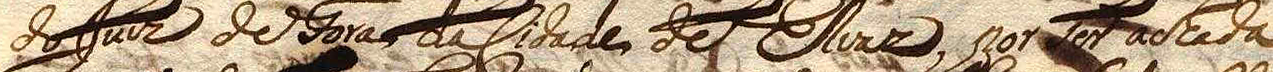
do Juiz de Fora da Cidade de Elvaz, por ser achada
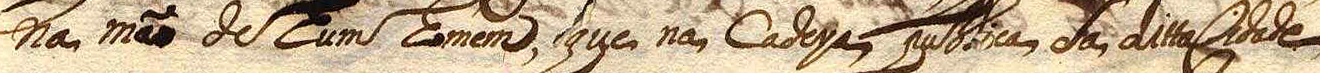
na mão de hum homem, que na Cadeya publica da ditta Cidade
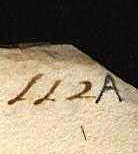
112
